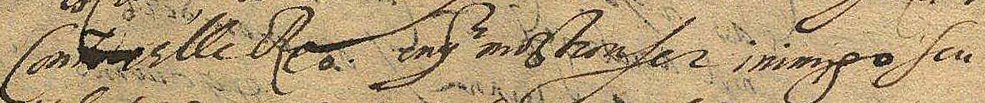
Contra Elle Reo en q̄ mostrou ser inimjgo seu
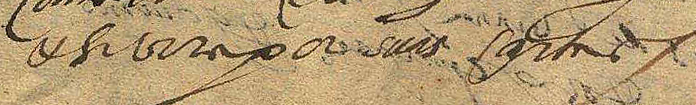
& se vera por suas Cartas
